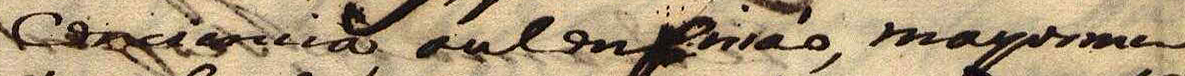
conciencia, ou confissaõ, mayormen
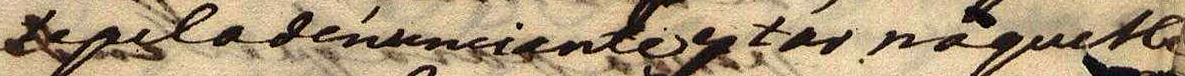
te pela denunciante estar naquelle
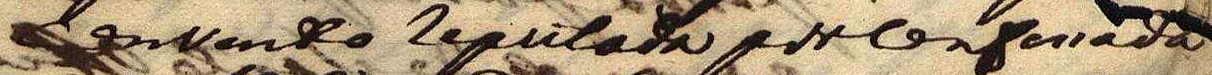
convento Reputada por confessada
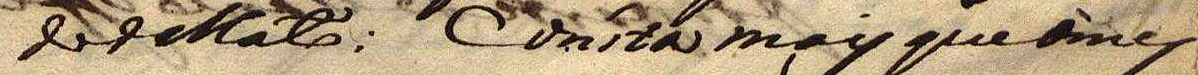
do dellato; Consta mais que o mes
